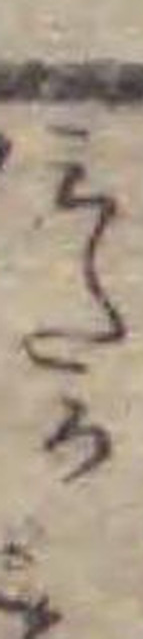みたか
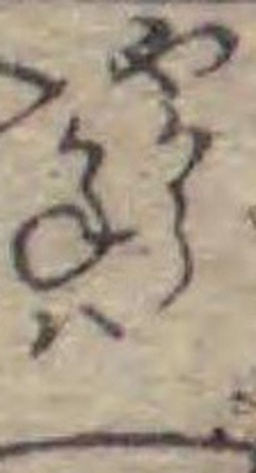かねは
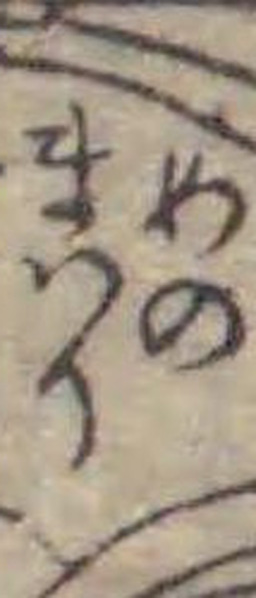まはり
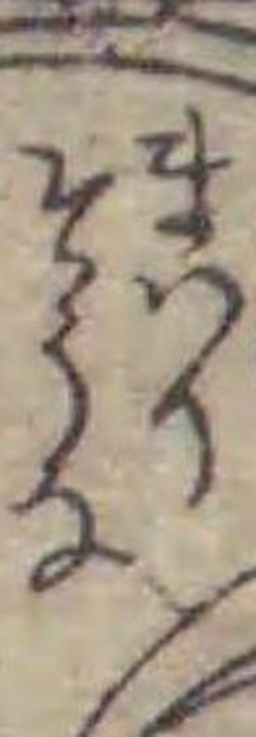そうな

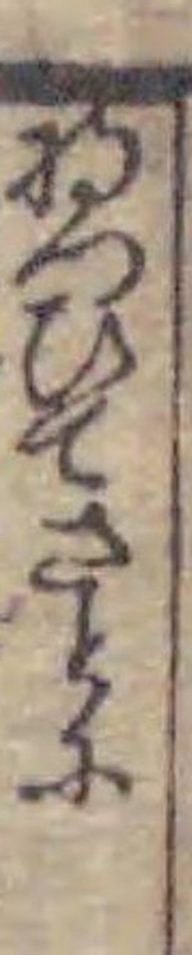将門ひてさとに
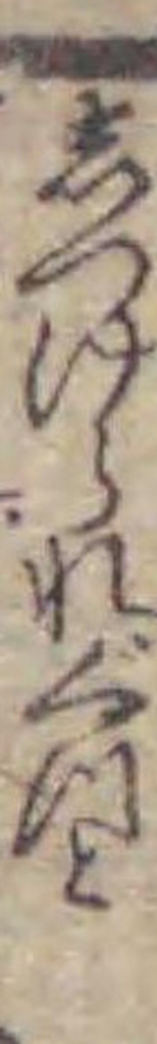しつけられぐつと
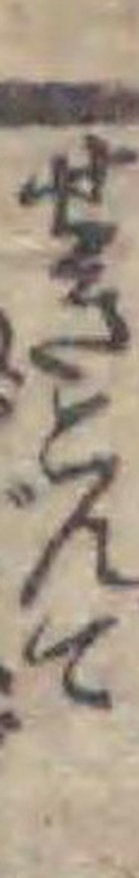せきこんで
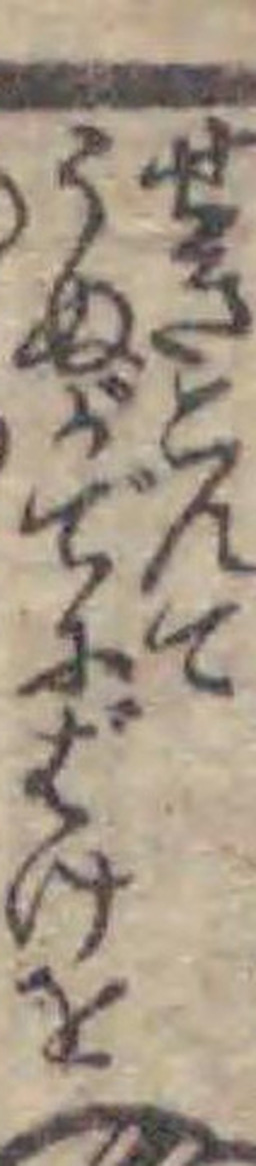うぬがでふばけを
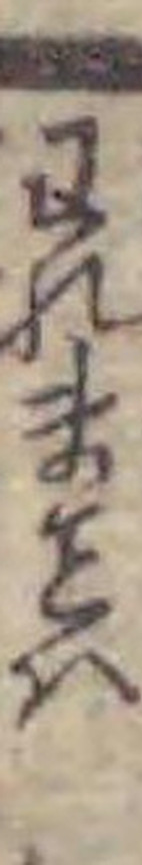われまことは
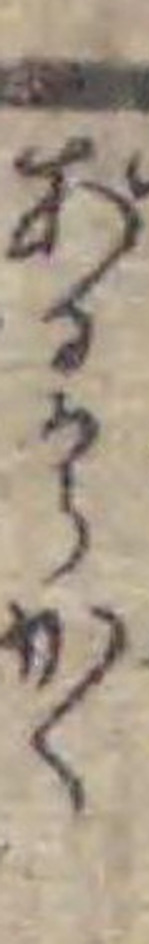あるからかく
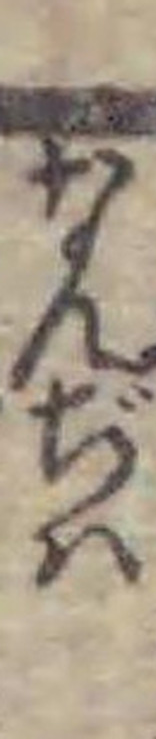なんぢは
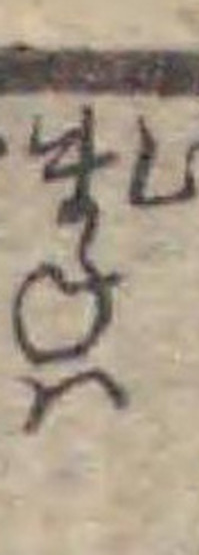まねは
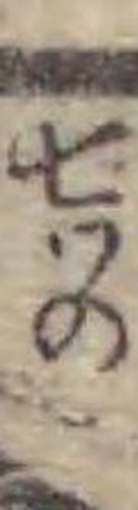七つの
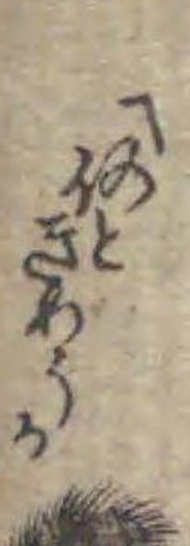〽何と
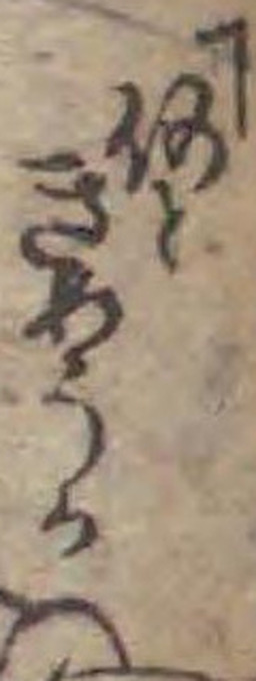きめうか
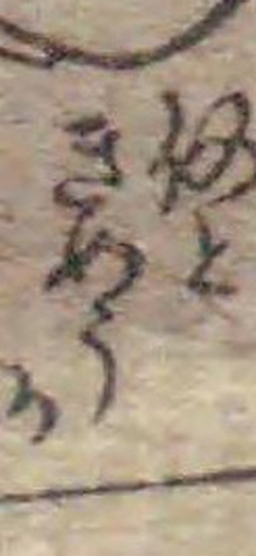きめうか
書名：時代世話二挺皷 : 2巻
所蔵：国立国会図書館 National Diet Library, JAPAN
